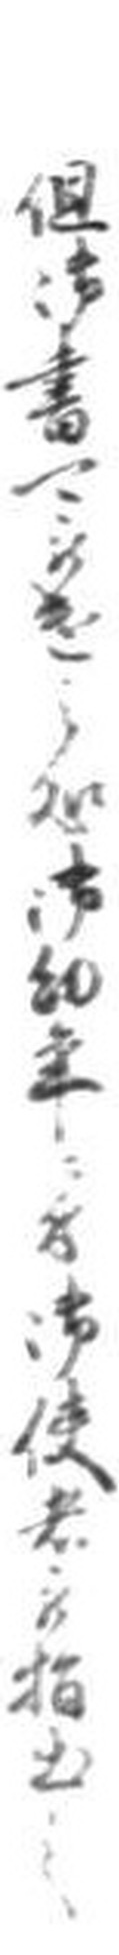但御書可被遣之処御幼年ニ付御使者被指出之
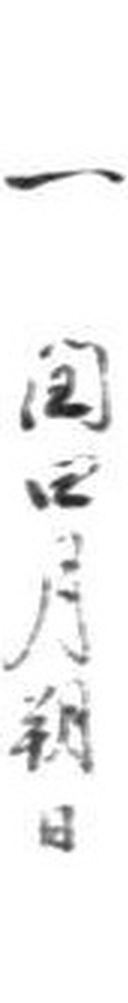一閏四月朔日
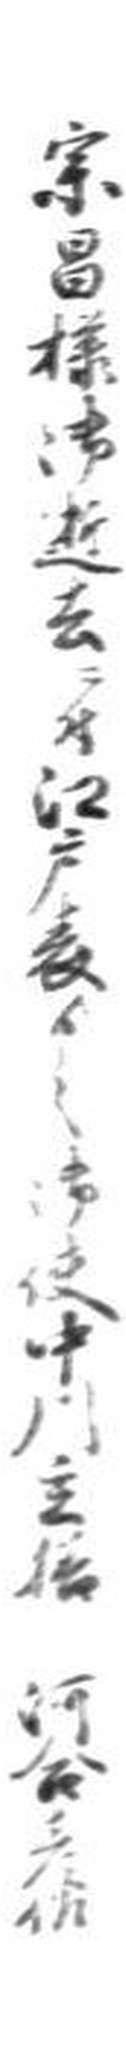宗昌様御逝去ニ付江戸表ゟ之御使中川主膳河合彦作
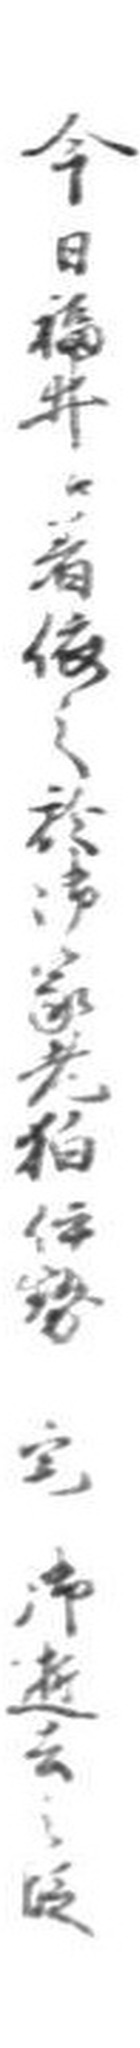今日福井江着依之於御家老狛伊勢宅御逝去之段
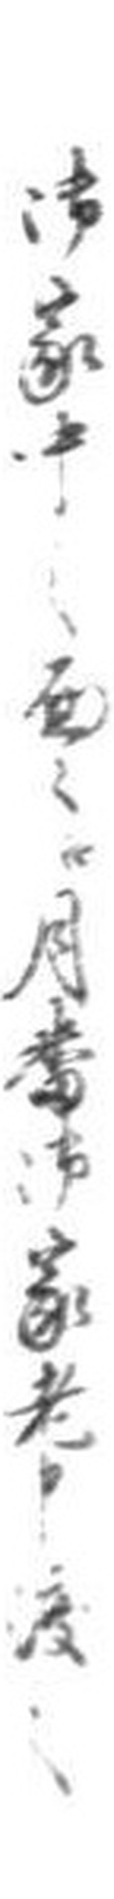御家中之面々江月番御家老申渡之

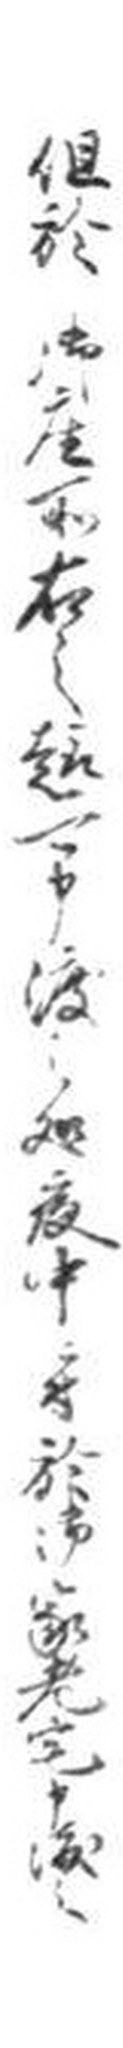但於御座所右之趣可申渡之処夜中ニ付於御家老宅申渡之
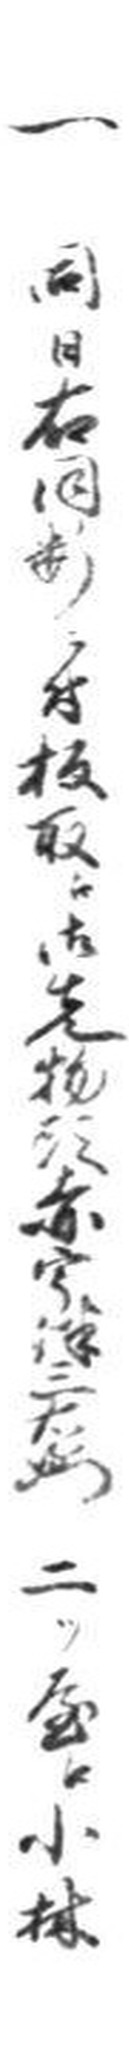一同日右同断ニ付板取江御先物頭赤宇津三右衛門二ツ屋江小林
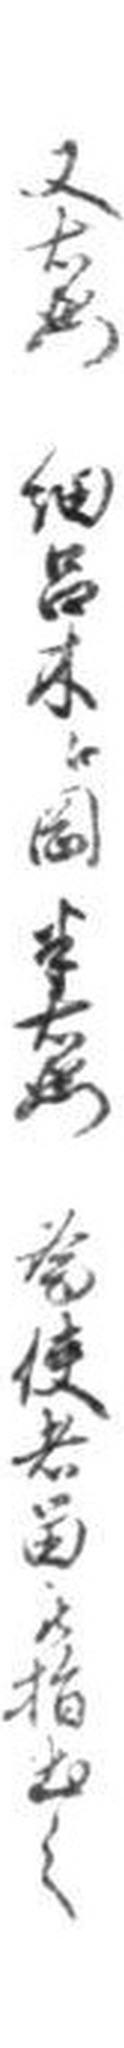又右衛門細呂木江岡半右衛門為使者留被指出之
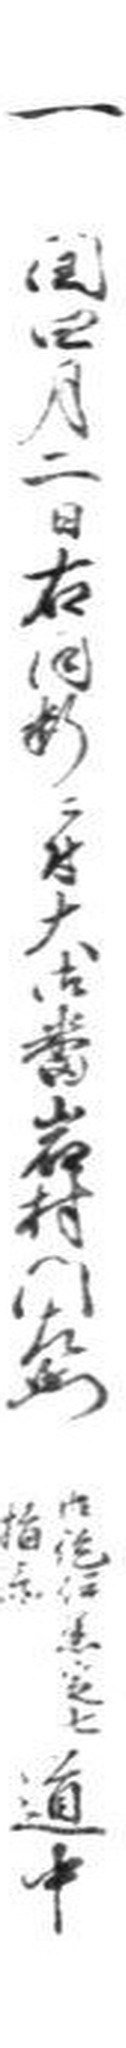一閏四月二日右同断ニ付大御番岩村門左衛門御徒伊黒定七指添道中
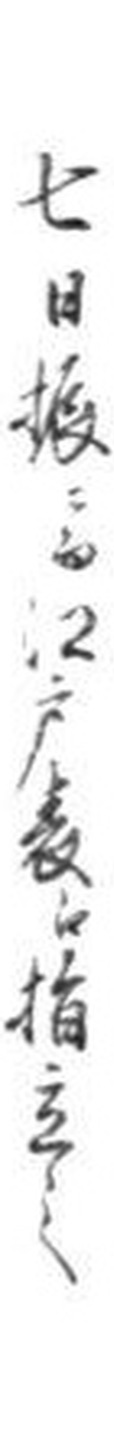七日振ニ而江戸表江指立之
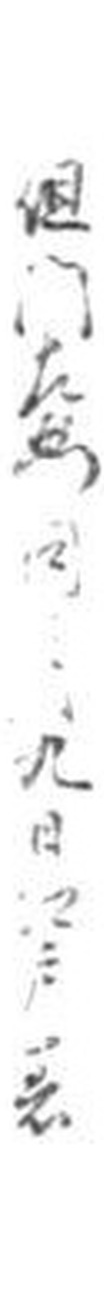但門左衛門同月九日江戸着
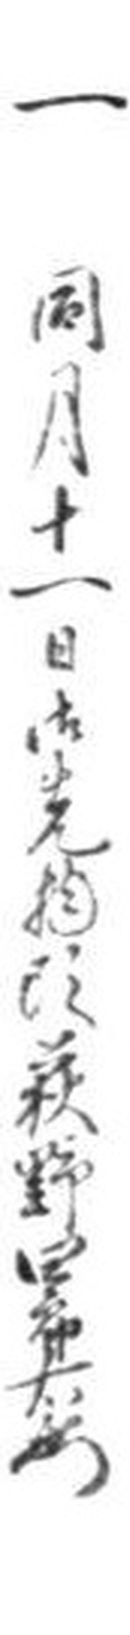一同月十一日御先物頭萩野四郎右衛門
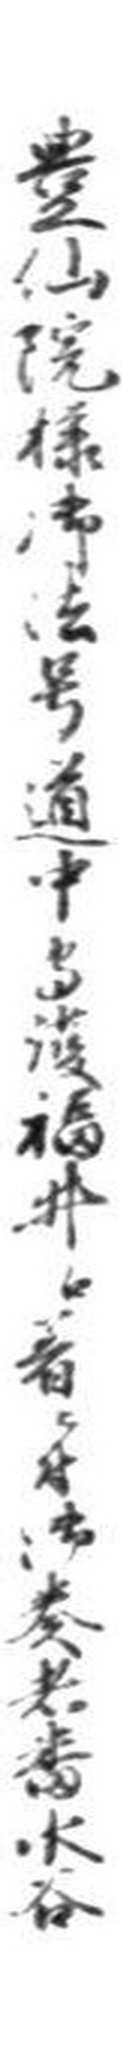豊仙院様御法号道中守護福井江着ニ付御奏者番水谷
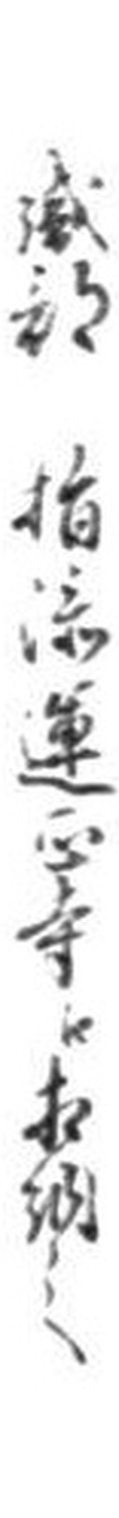織部指添運正寺江相納之
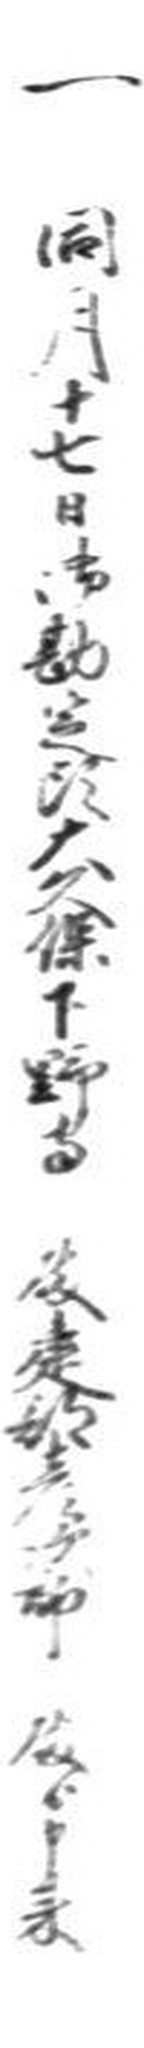一同月十七日御勘定頭大久保下野守殿建部彦次郎殿ゟ申来
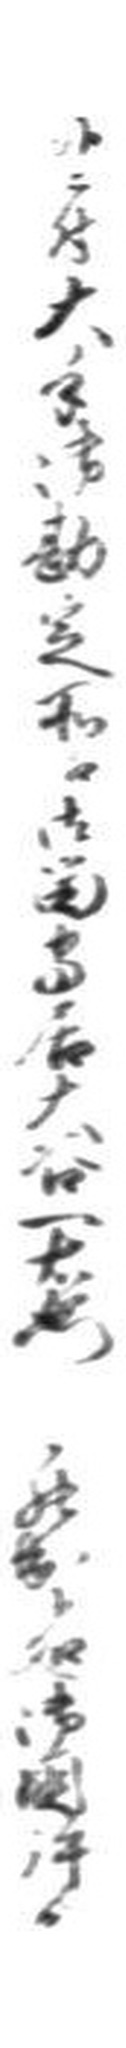候ニ付大手勘定所江御留守居大谷一右衛門罷出候処御国許ゟ
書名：家譜 三十七 宗矩公 従正徳五年到享保九年五月
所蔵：福井県文書館 Fukui Prefectural Archives
